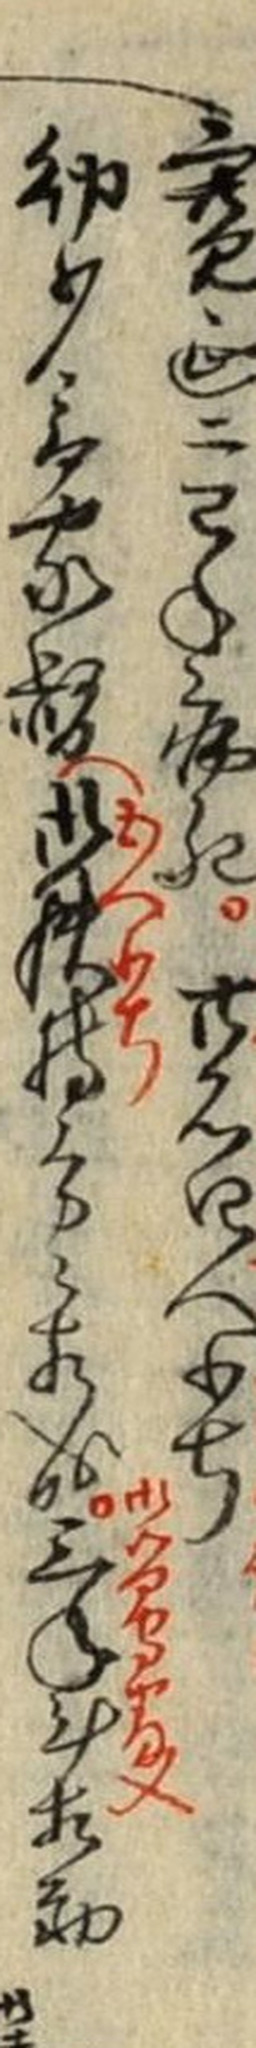幼少に而家督御扶持方に相成三年斗相勤
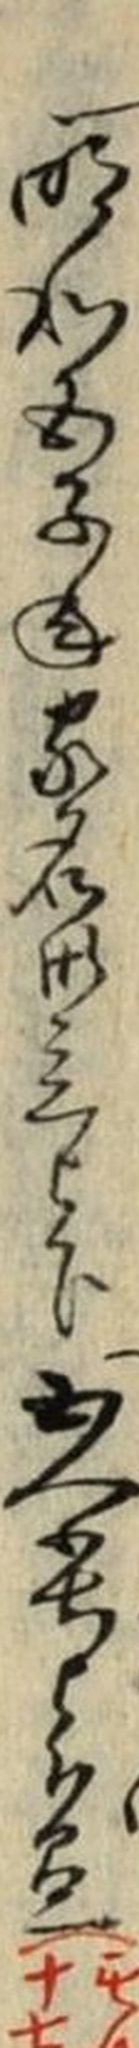明和五子年家名御立被下五人扶持被下置
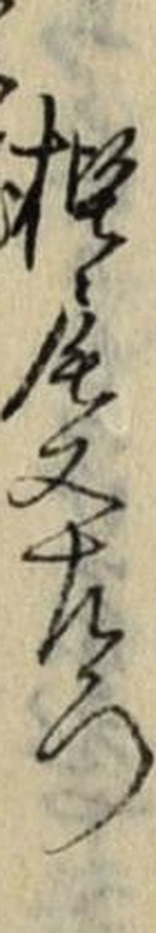樫尾又左衛門
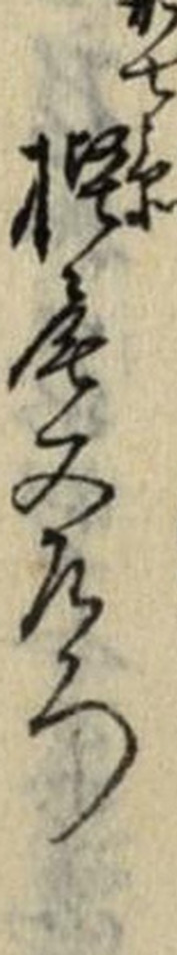樫尾又左衛門
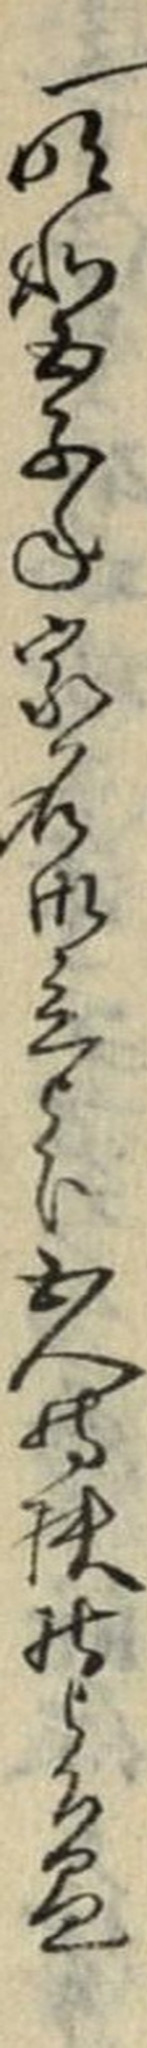明和五子年家名御立被下五人扶持被下置
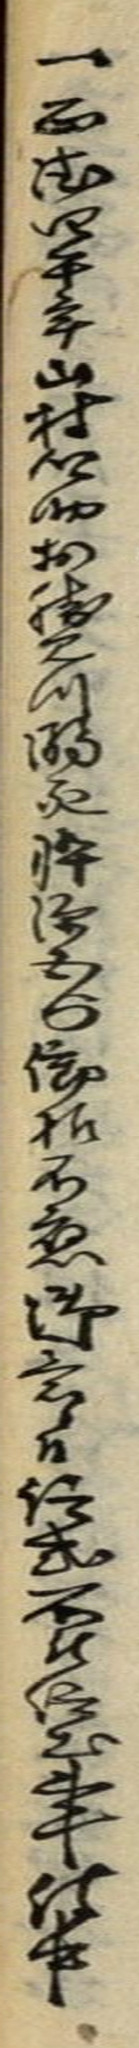一正徳四午年山村郷助於小浦見川溺死忰源五右衛門働損不慮御定に付跡式不被仰出事侍中
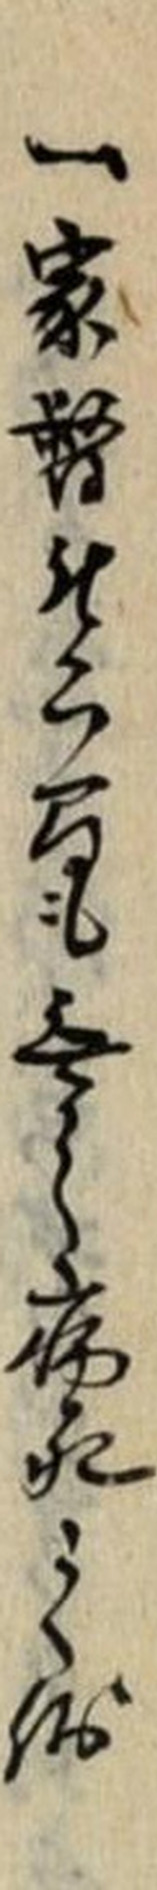一家督被下間も無く病死之例
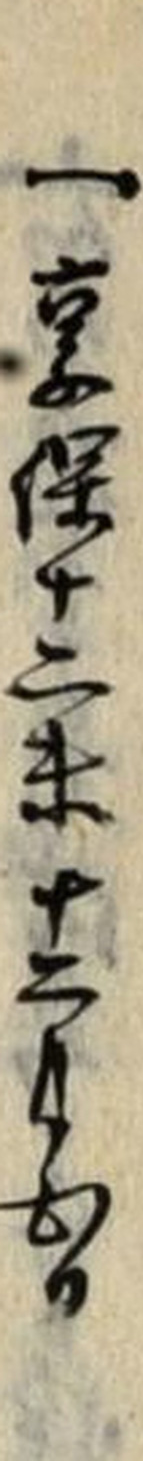一享保十二未十二月五日
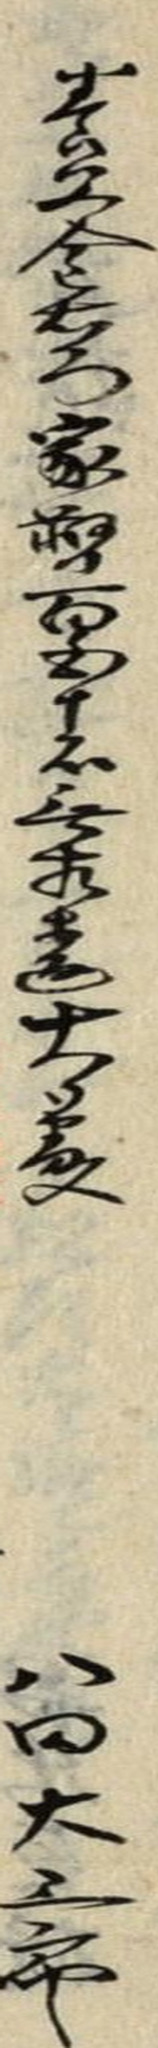養父勤右衛門家督百五拾石無相違大御番入八田大三郎
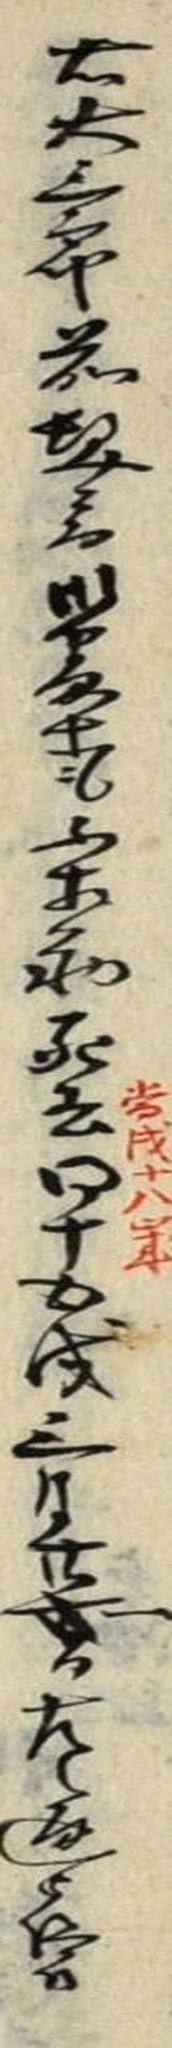右大三郎前髪に而御番等も相不相勤死去同十五戌三月廿一日左之通被仰付
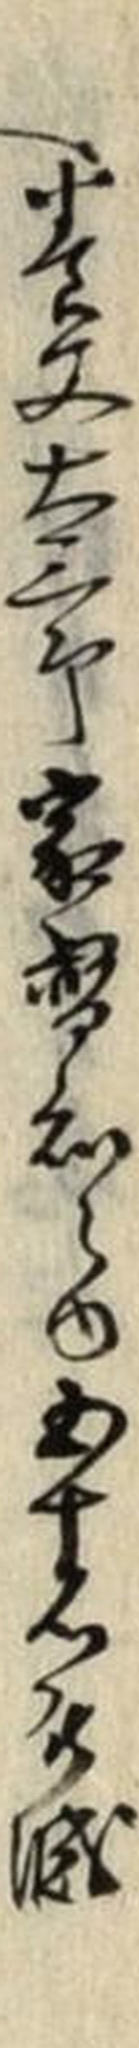養父大三郎家督知之内五十石被減
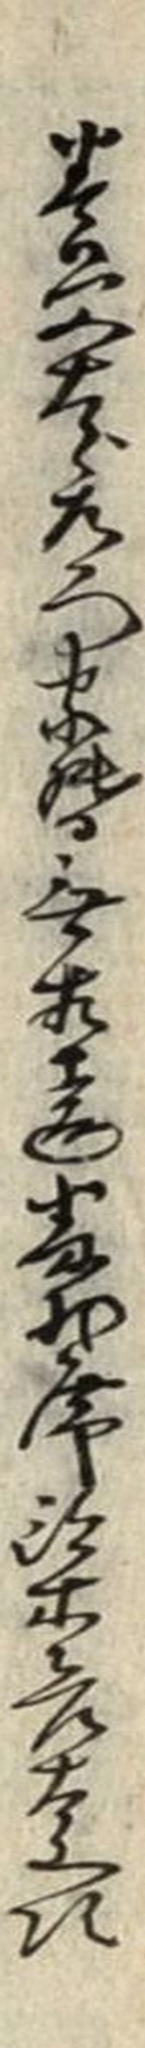養父太郎左衛門家督無相違番外席鈴木彦太夫次渡辺金蔵
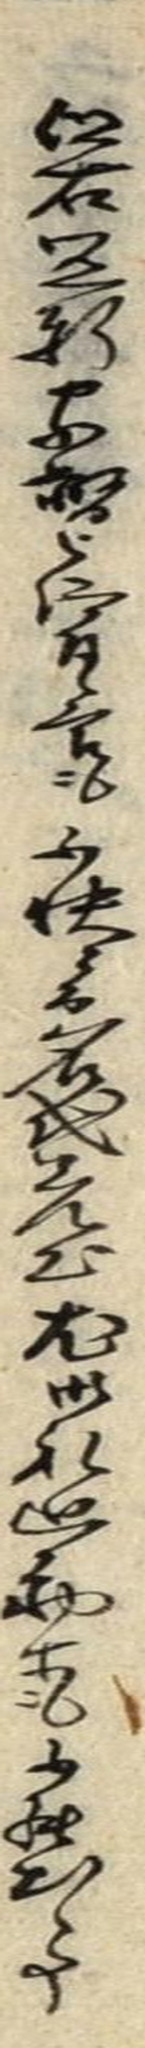但右宜軒家督被仰付候節も不快に付名代差出尤御礼廻勤等も不罷出候事
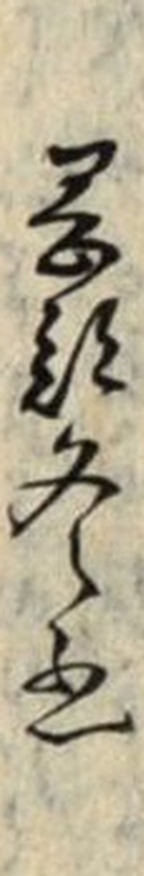岡部又之丞

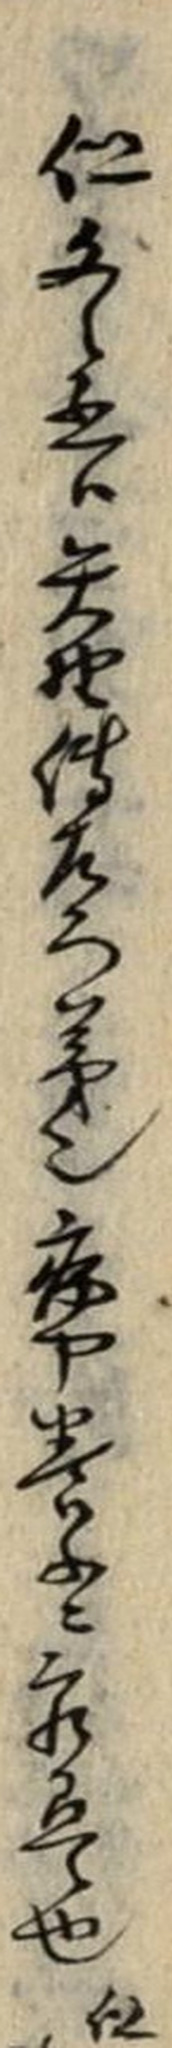但文之丞は矢野伝左衛門弟也病中養子に願有候也
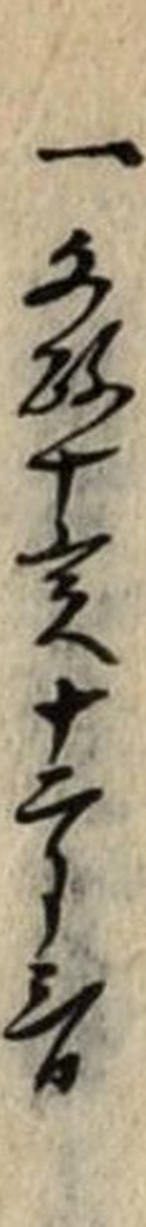一文政十亥十二月三日
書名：御用并被仰出之部
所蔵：福井県文書館 Fukui Prefectural Archives
